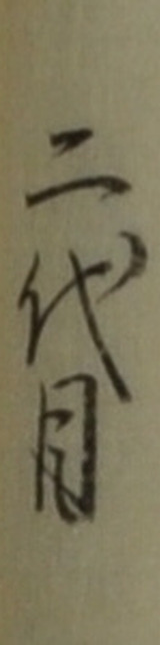二代目
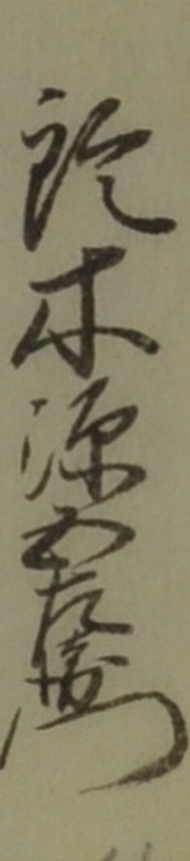鈴木源五左衛門
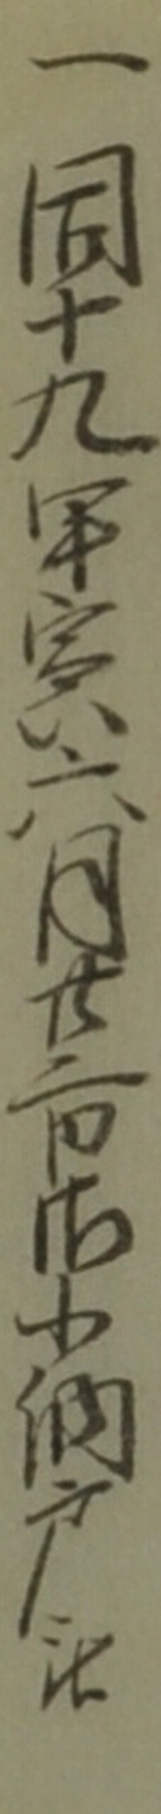一同十九甲寅六月廿二日御小納戸被
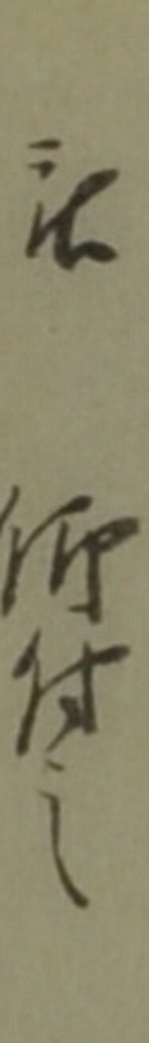被仰付之
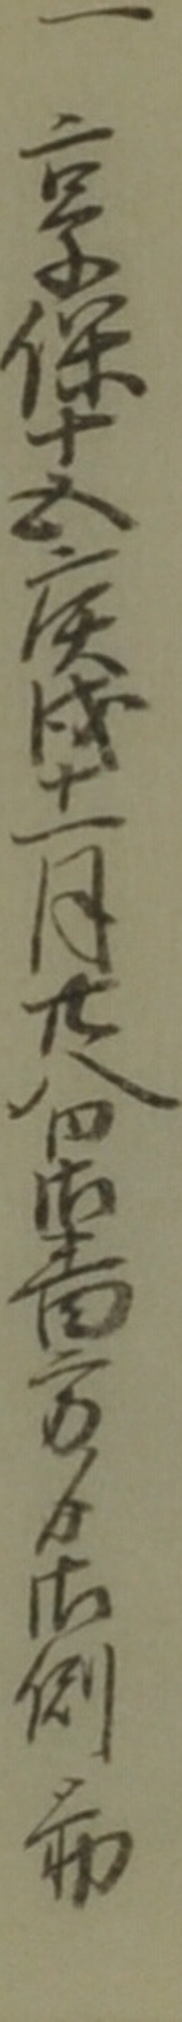一享保十五庚戌十一月廿八日御番方ゟ御側勤
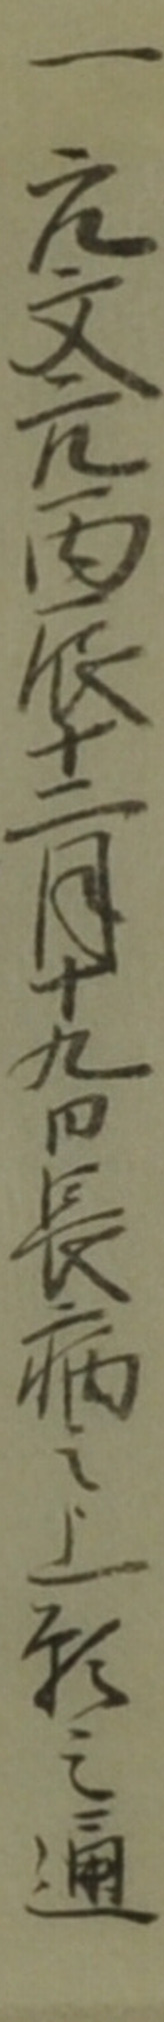一元文元丙辰十二月十九日長病之上願之通
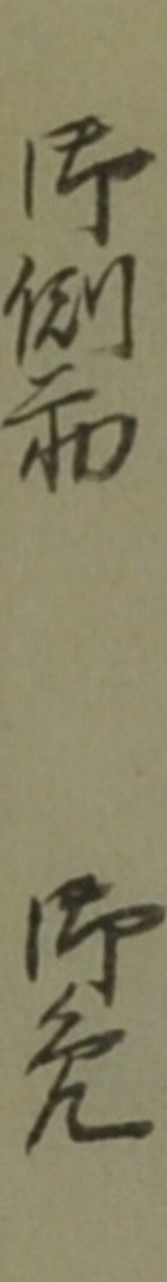御側勤御免
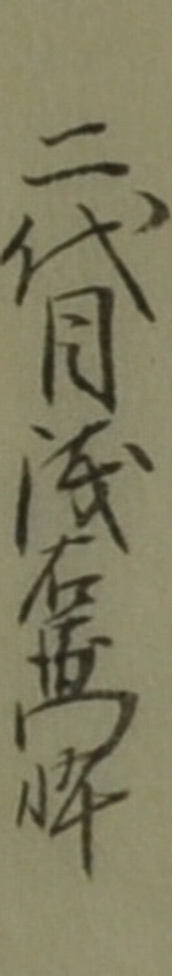二代目浅右衛門
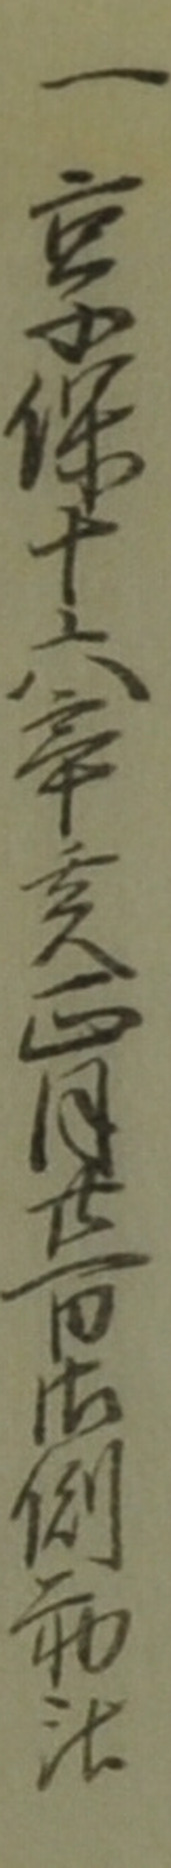一享保十六辛亥正月廿一日御側勤被
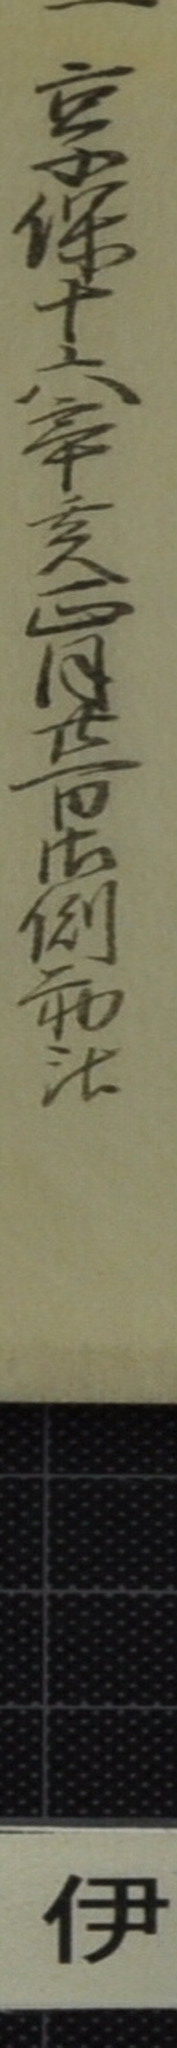一享保十六辛亥正月廿一日御側勤被
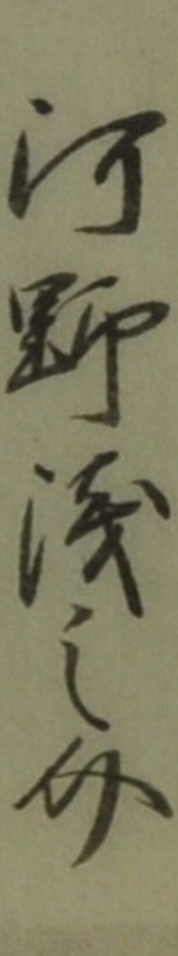河野浅之介
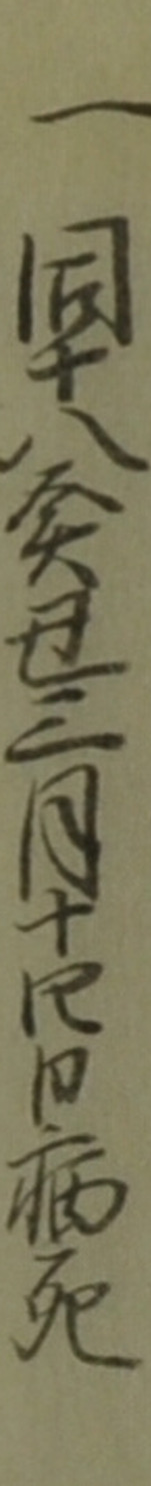一同十八癸丑三月十四日病死
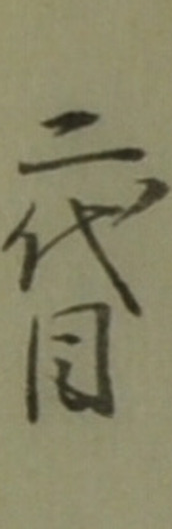二代目
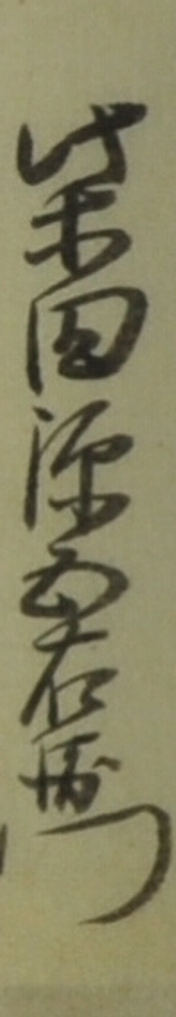柴田源五右衛門

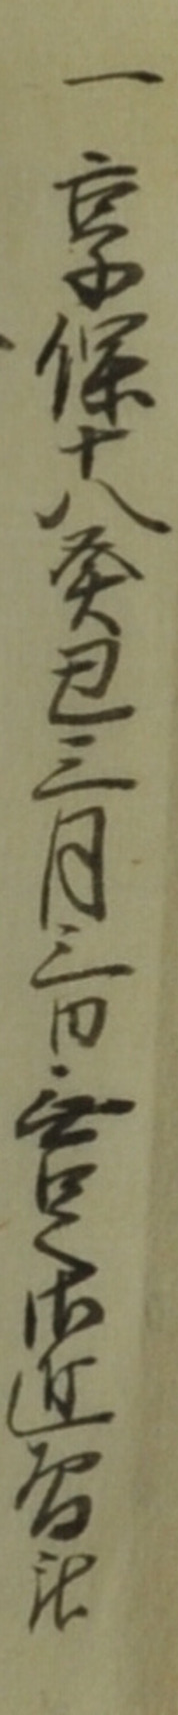一享保十八癸丑三月三日無足御近習被
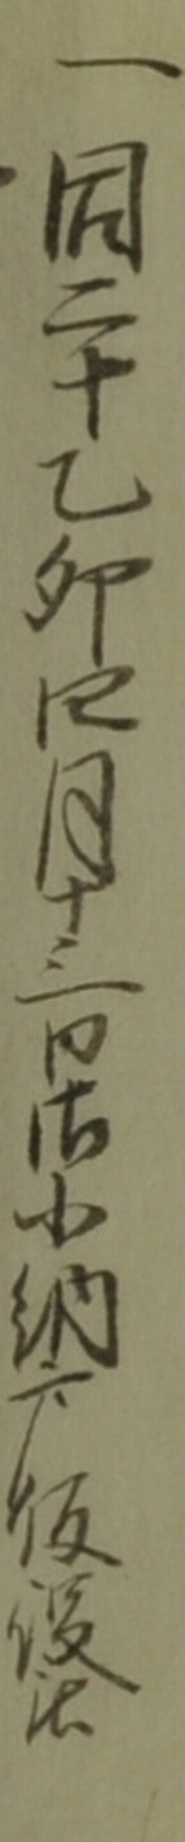一同二十乙卯四月十三日御小納戸仮役被
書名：諸御役代々録（五）
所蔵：伊那市立高遠町図書館・合同会社AMANE
